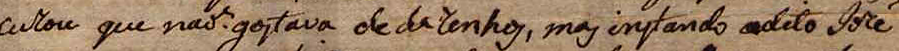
cuzou que naõ gostava de dezenhos, mas instando o dito Jozé
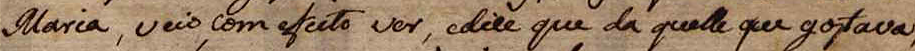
Maria, veio com efeito ver, e dice que daquelle que gostava,
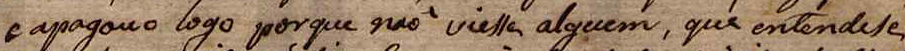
e apagou o logo por que naõ viesse alguem, que entendese;
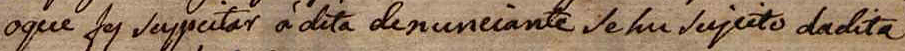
o que fez suspeitar á dita denunciante se hu sujeito da dita
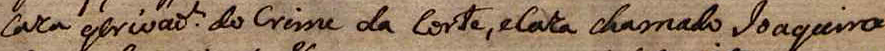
caza escrivaõ do Crime da Corte, e Caza chamado Joaquim
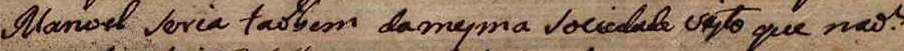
Manoel seria taõbem da mesma sociedade visto que naõ
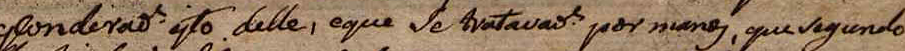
esconderaõ isto delle, e que se tratavaõ por manos, que segundo
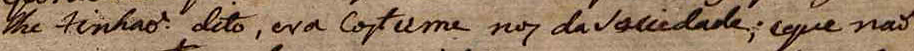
lhe tinhaõ dito, era costume nos da sociedade; e que naõ
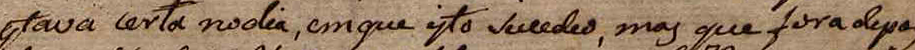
estava certa no dia, em que isto sucedeo, mas que fora depois
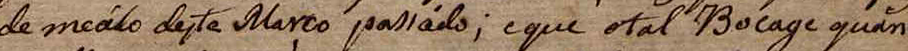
de meado deste Março passado; e que o tal Bocage quan
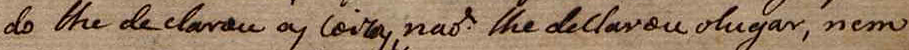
do lhe declarou as coizas, naõ lhe declarou o lugar, nem
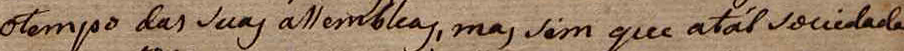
o tempo das suas assembleas, mas sim que a tal sociedade
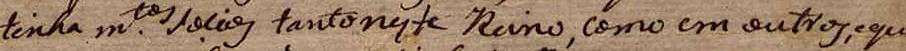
tinha m.tos soçios tanto neste Reino, como em outros, e que
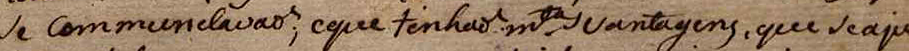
se communicavaõ; e que tinhaõ m.tas vantagens, que se aju
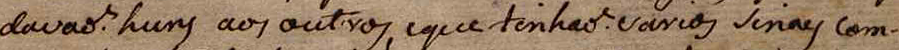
davaõ huns aos outros, e que tinhaõ varios sinaes com
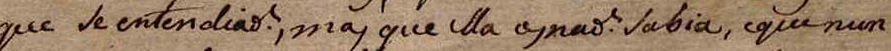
que se entendiaõ, mas que ella os naõ sabia, e que nun
